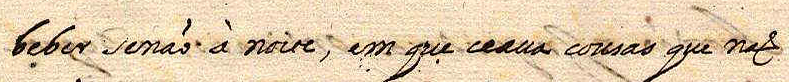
beber senaõ à noite, em que ceaua cousas que naõ
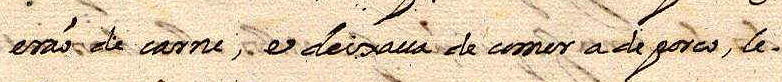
eraõ de carne, e deixaua de comer a de porco, le
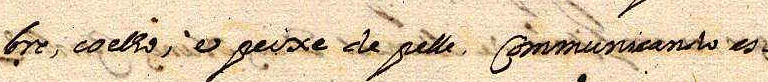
bre, coelho, e peixe de pelle. Communicando es
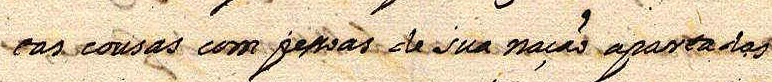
tas cousas com pessoas de sua naçaõ apartadas
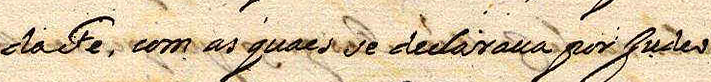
da Fe, com as quaes se declaraua por Judeo.
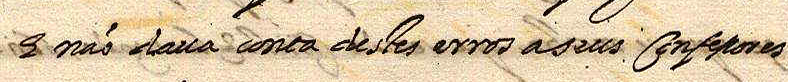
E naõ daua conta destes erros a seus Confessores
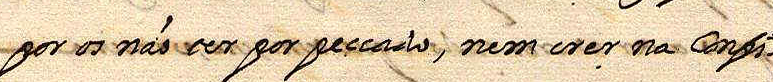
por os naõ ter por peccado, nem crer na Confi
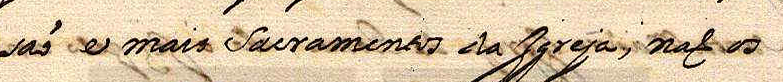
saõ e mais sacramentos da Jgreja, naõ os
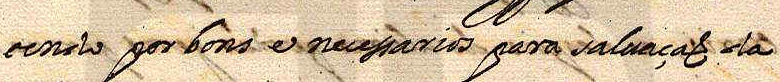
tendo por bons e necessarios para saluaçaõ da
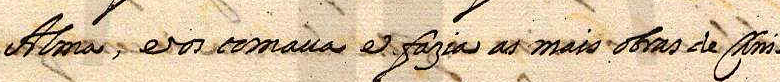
Alma, e os tomaua e fazia as mais obras de Chris
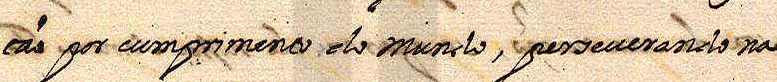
taõ, por cumprimento do mundo, perseuerando na
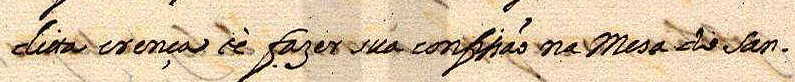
ditta crença tè fazer sua cofissaõ na Mesa do san
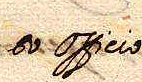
to Officio.
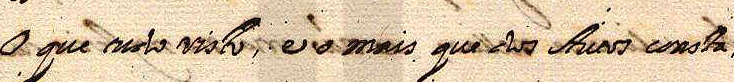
O que tudo visto, e o mais que dos Autos consta,
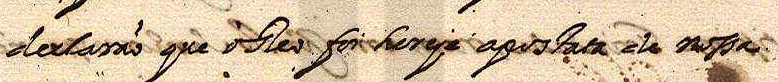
declaraõ que o Reo foi hereje apostata de nossa
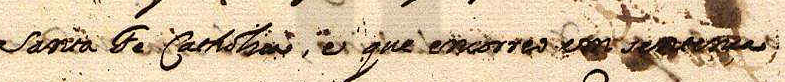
santa Fe Catholica, e que encorreo em sentença
